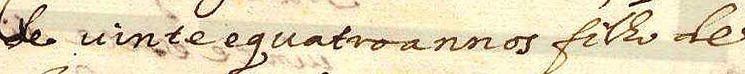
de uinte e quatro annos filho de
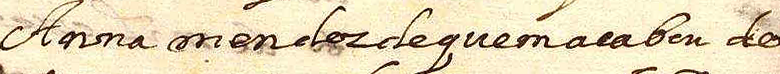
Anna mendez de quem acabou de
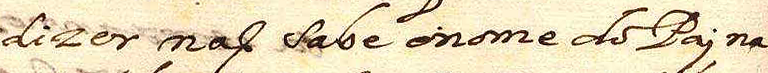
dizer naõ sabe o nome do Paj, na
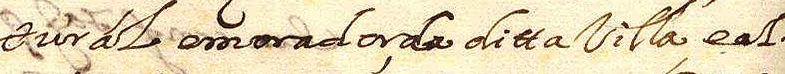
turaL e morador, da ditta villa, e aL
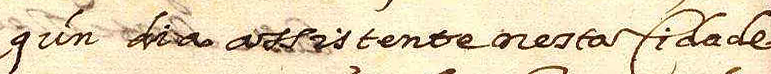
gún dia assistente nesta Cidade
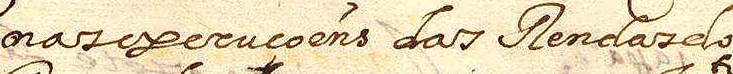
nas execuçoen̄s das Rendas do
